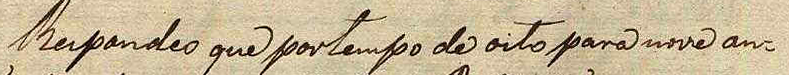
Respondeo que por tempo de oito para nove an
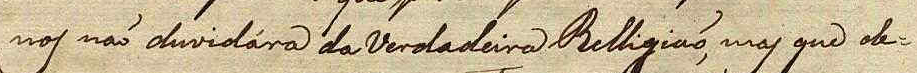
nos naõ duvidára da Verdadeira Relligiaõ, mas que de
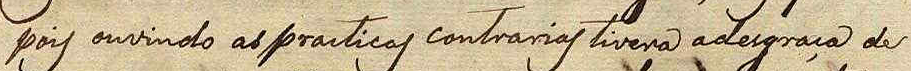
pois ouvindo as practicas contrarias tivera a desgraça de
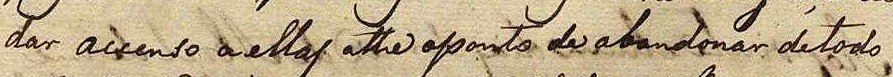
dar accenso a ellas athe o ponto de abandonar de todo
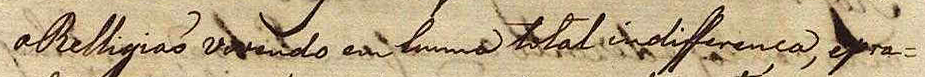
a Relligiaõ vivendo em huma total indifferença, e pra
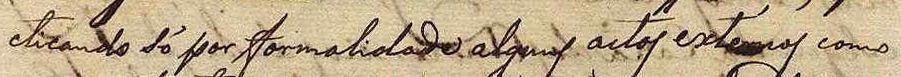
cticando só por formalidade alguns actos externos como
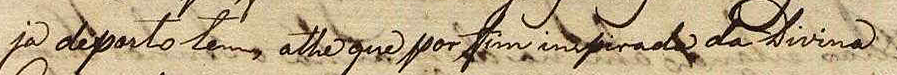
ja deposto tem, athe que por fim inspirada da Divina
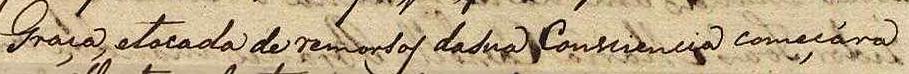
Graça, e tocada de remorsos da sua Consciencia começára
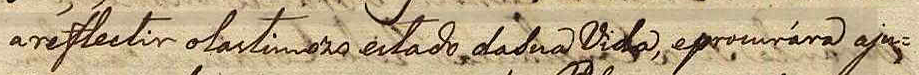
a reflectir o lastimozo estado da sua Vida, e procurára aju
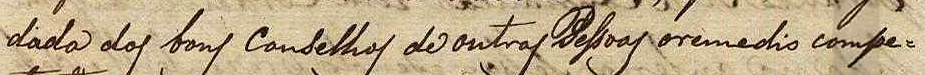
dada dos bons conselhos de outras Pessoas o remedio compe
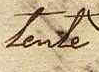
tente
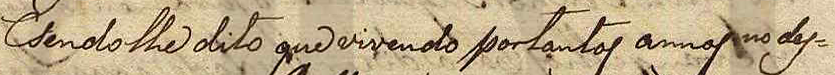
E sendolhe dito que vivendo por tantos annos no des
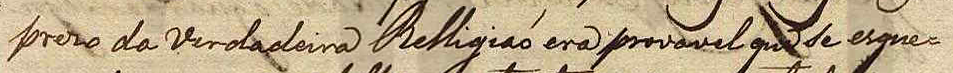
prezo da verdadeira Relligiaõ era provavel que se esque
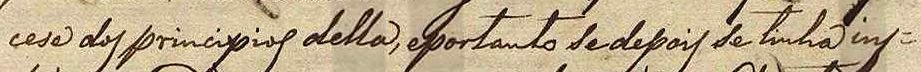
cese dos principios della, e portanto se depois se tinha ins
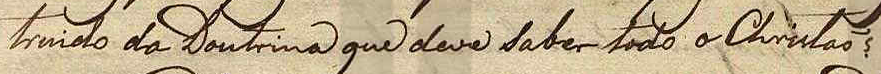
truido da Doutrina que deve saber todo o Christaõ?
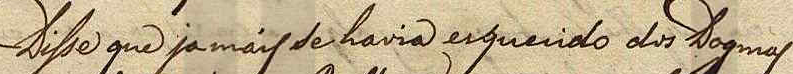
Disse que jamais se havia esquecido dos Dogmas
